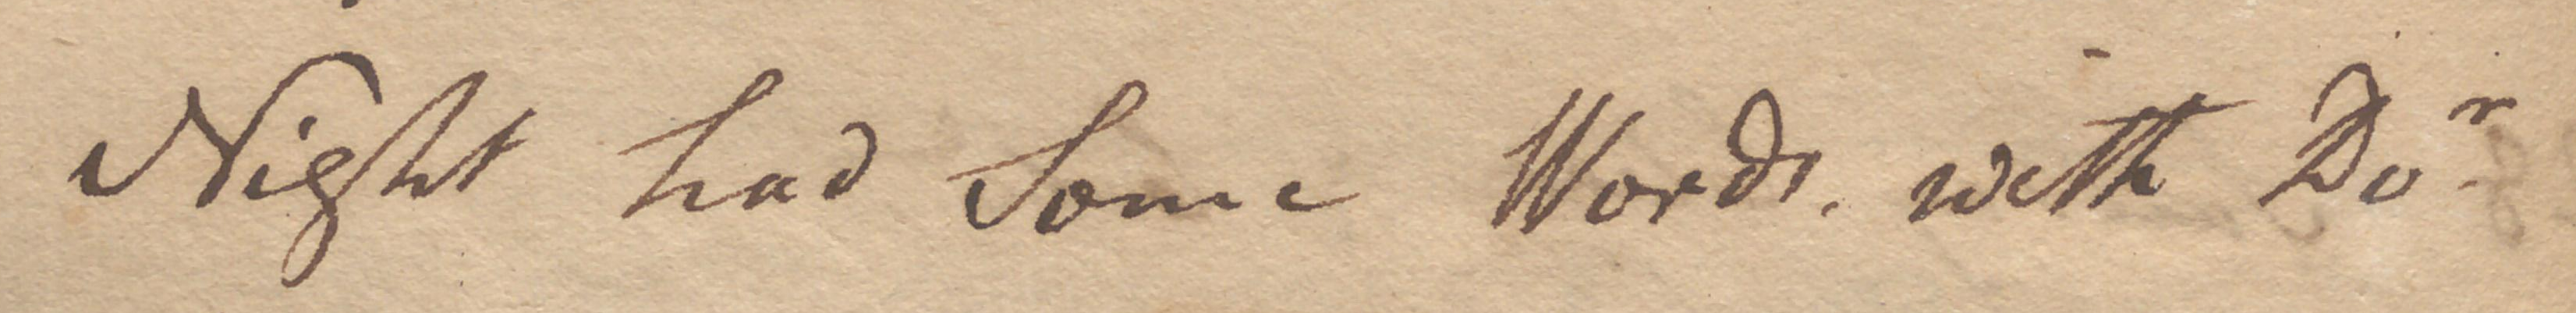Night had Some Words with Do^r.
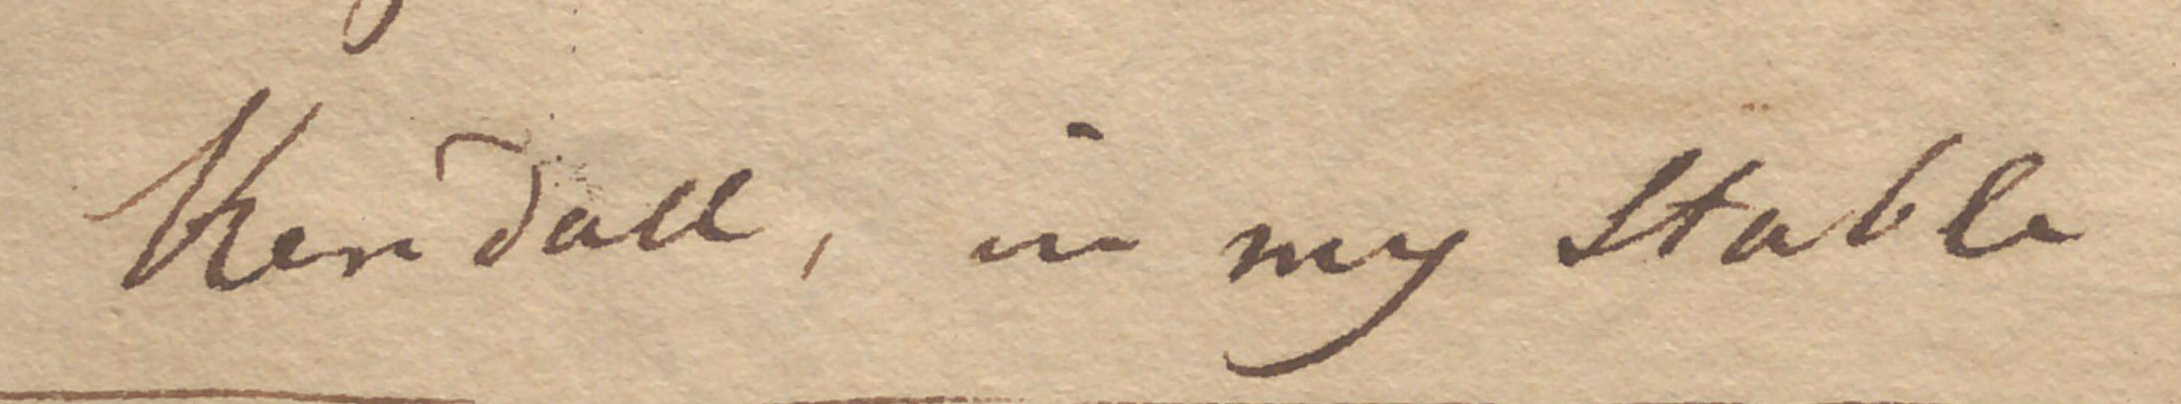Kendall, in my stable
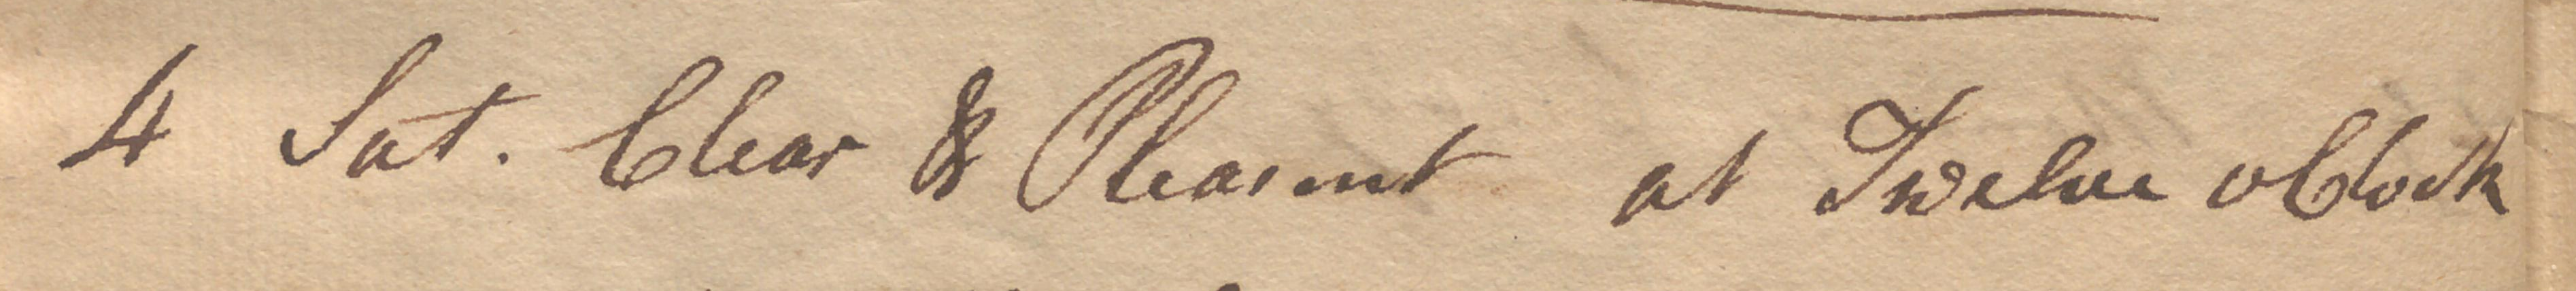4 Sat. Clear & Pleasent at Twelve oClock
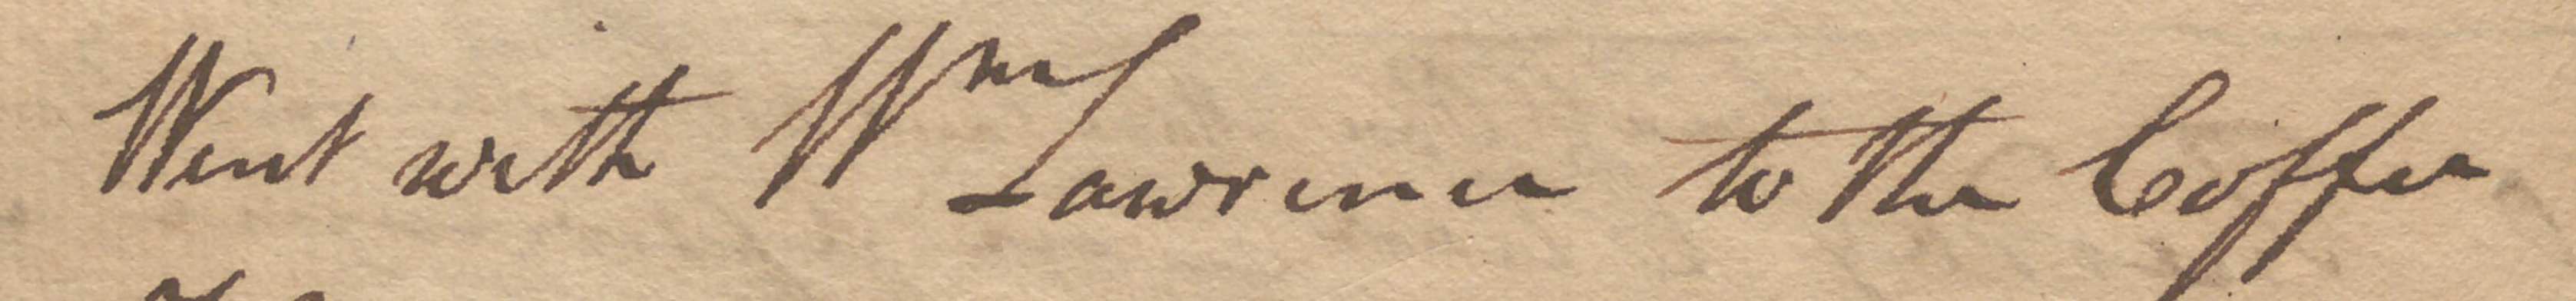Wint with W^m Lawrence to the Coffer
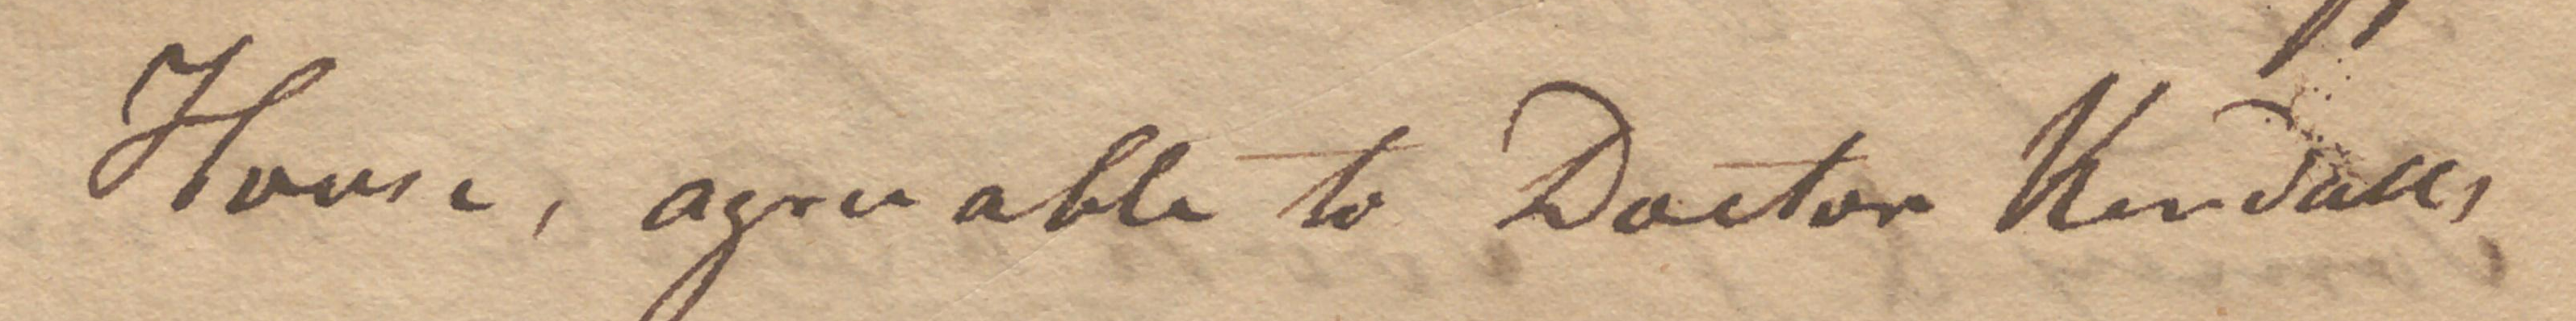House, agreeable to Doctor Kendalls
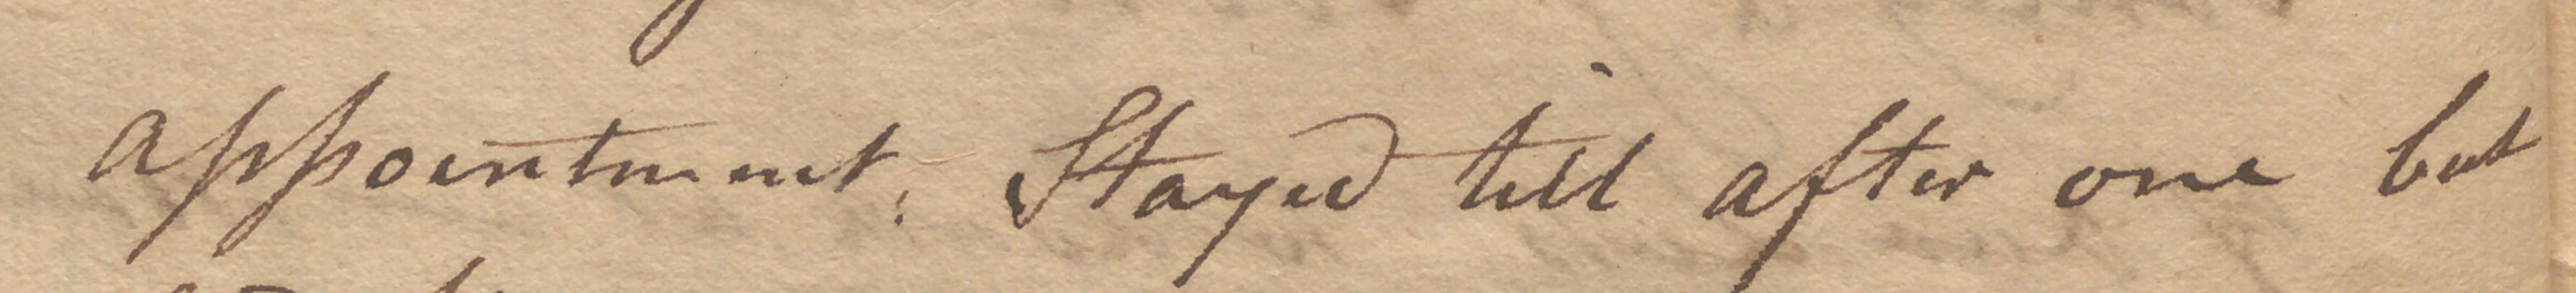appointment. Stayed till after one but
